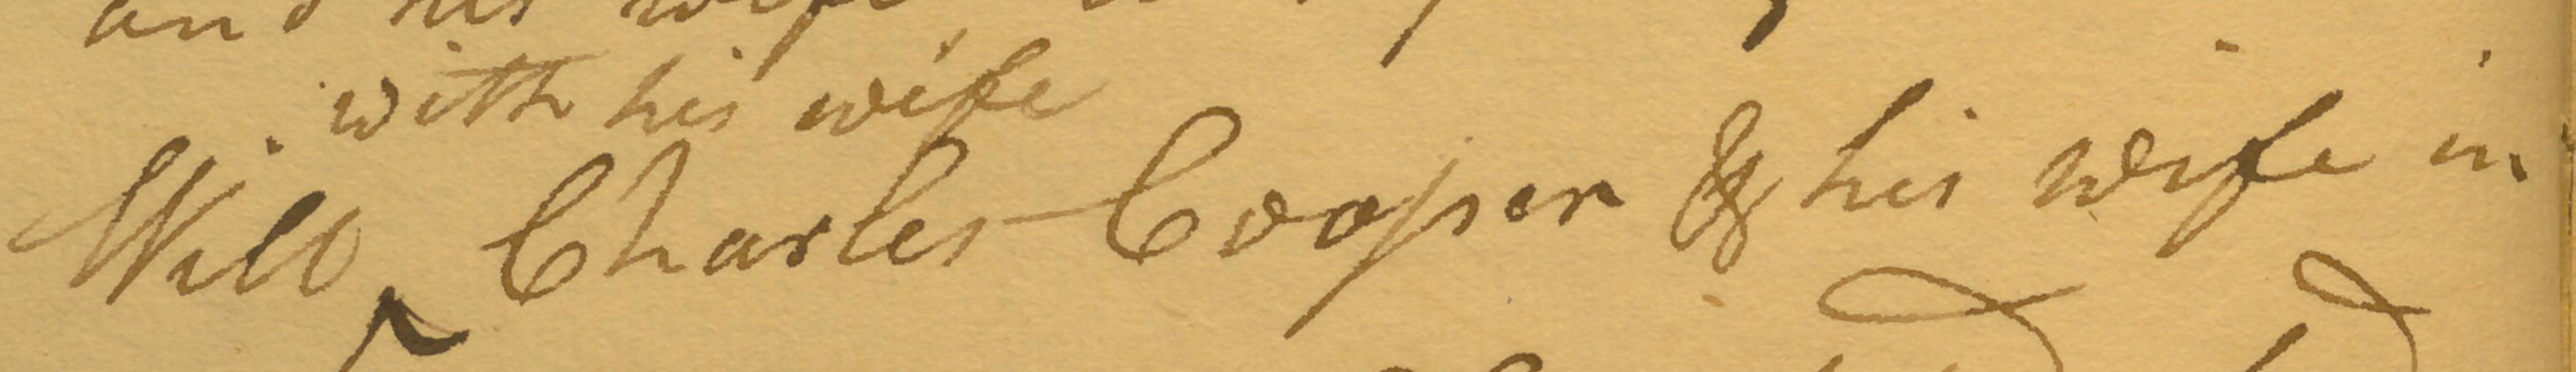Will ^ Charles Cooper & his wife in
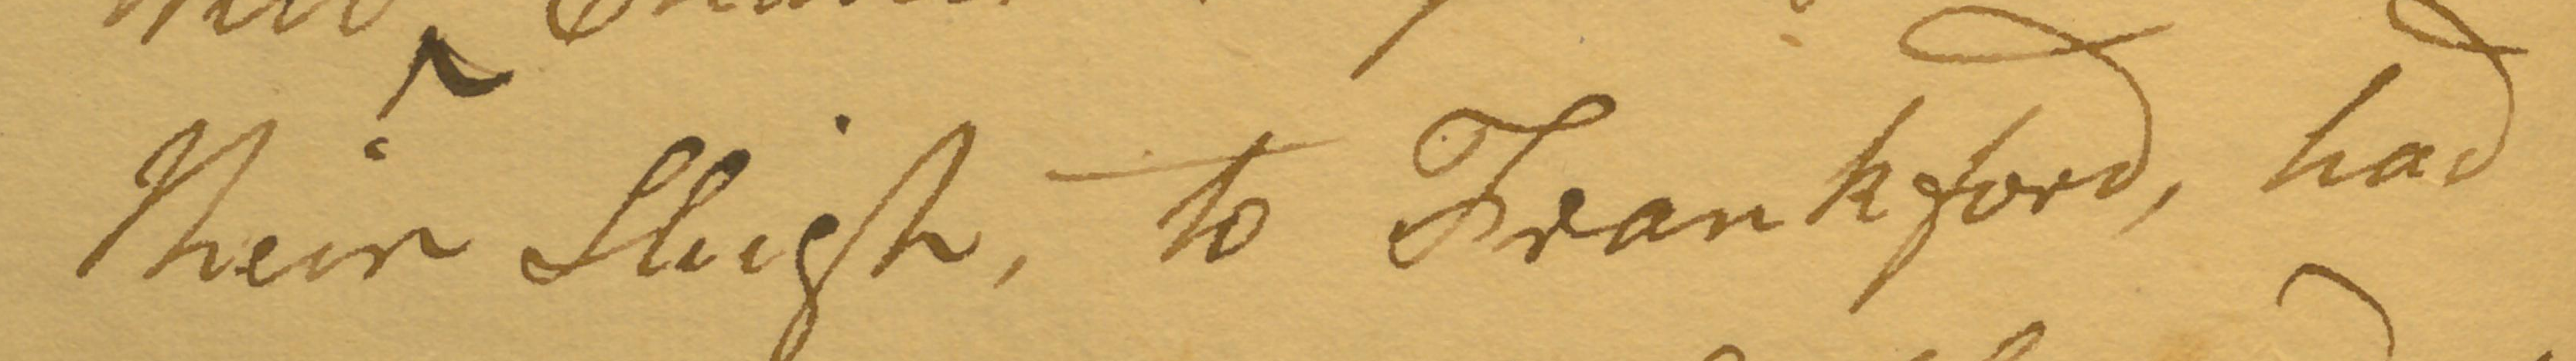Their Sleigh, to Frankford, had
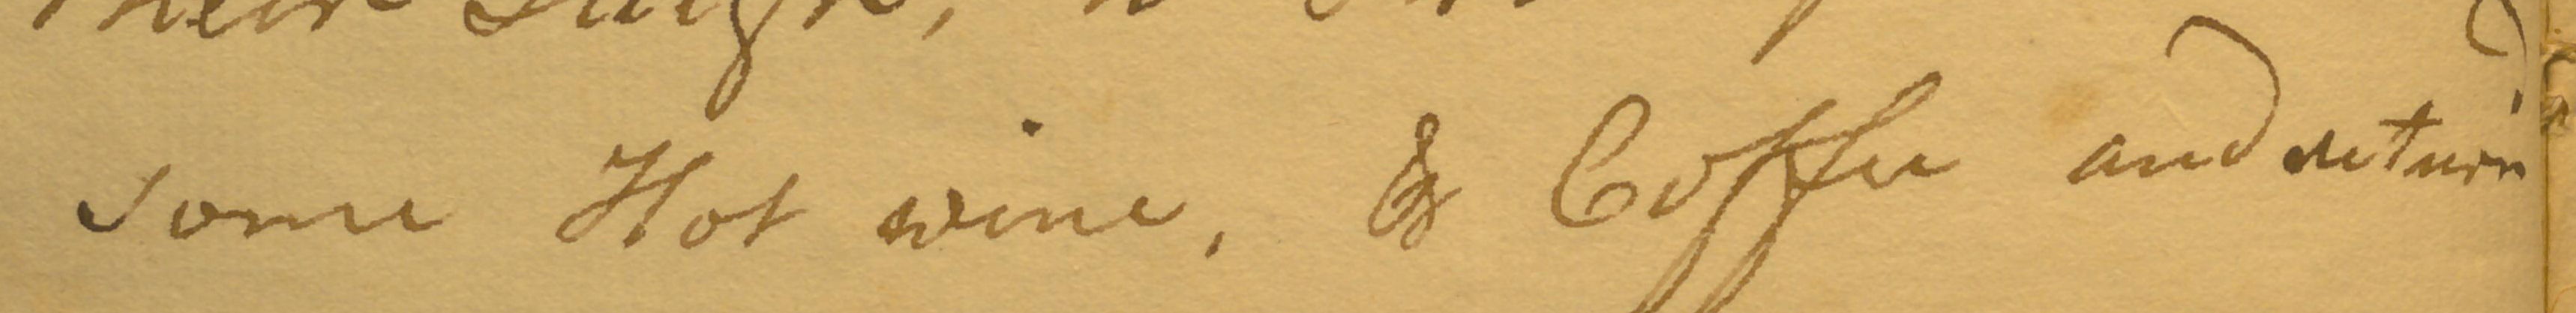some Hot wine, & Coffee and return^d
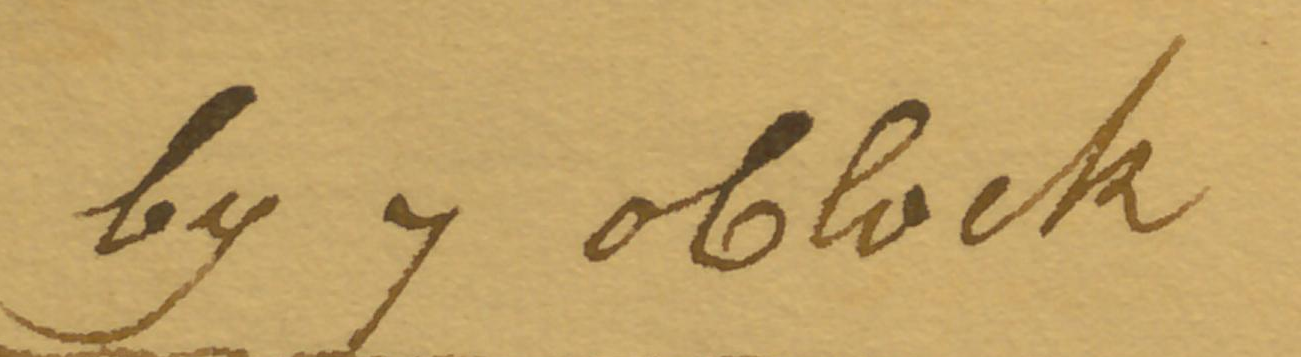by 7 oClock
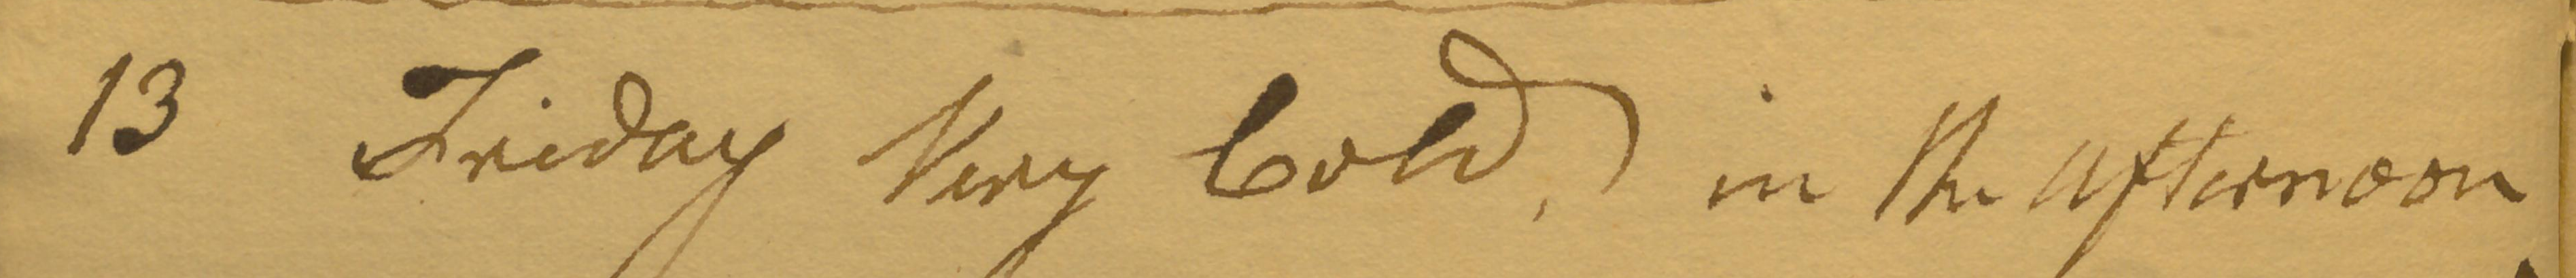13 Friday Very Cold, in the afternoon
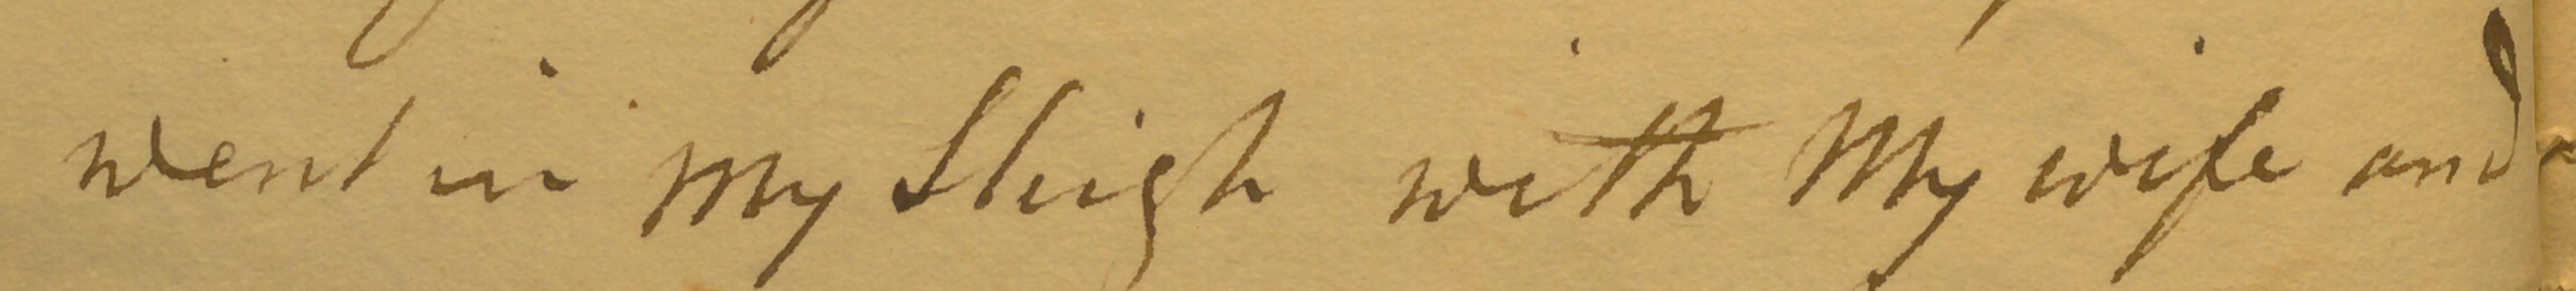went in My Sleigh with My wife and
